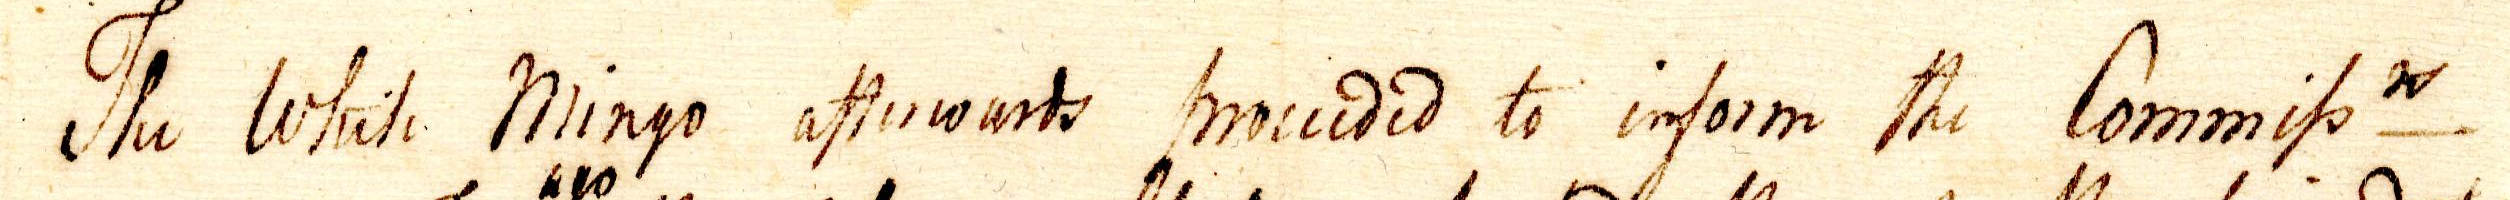The White Mingo afterwards proceeded to inform the Commiss^rs
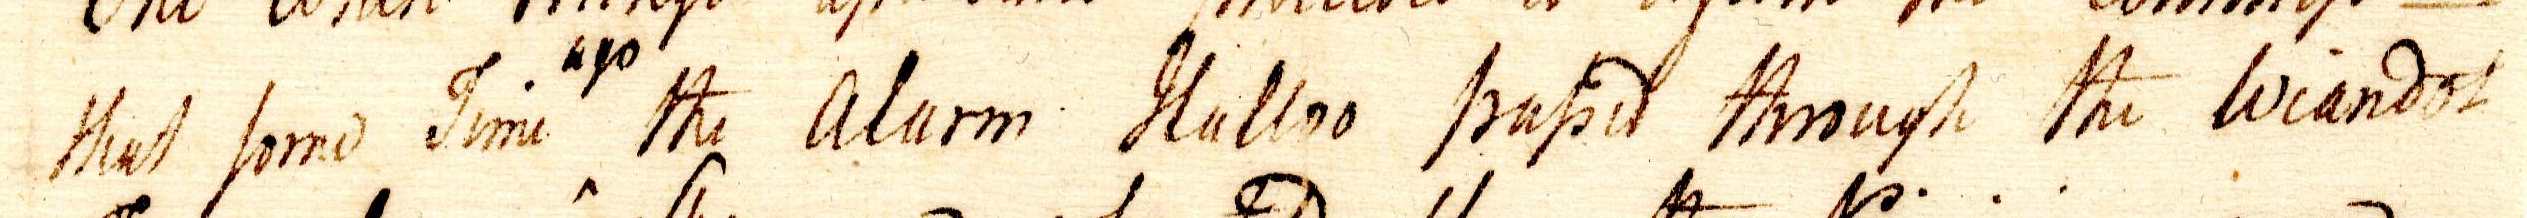that some Time ^ago the Alarm Halloo passed through the Wiandot
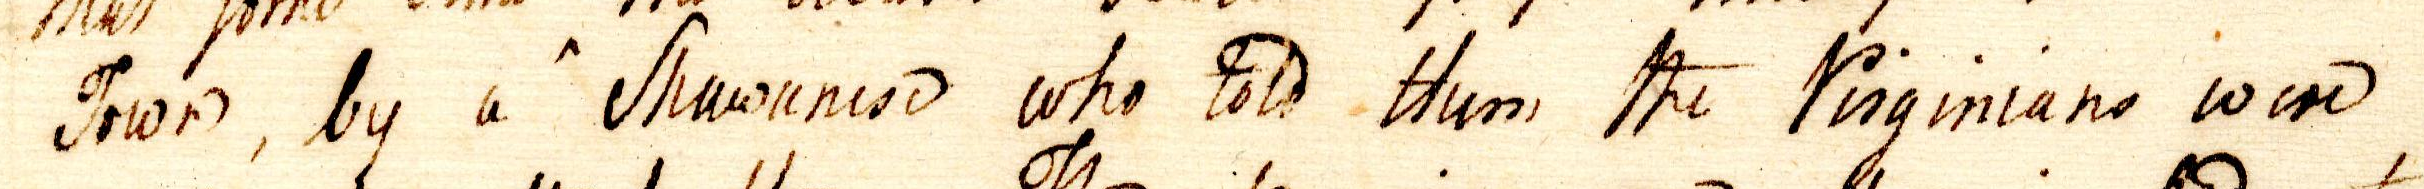Town, by a Shawanese who told them the Virginians were
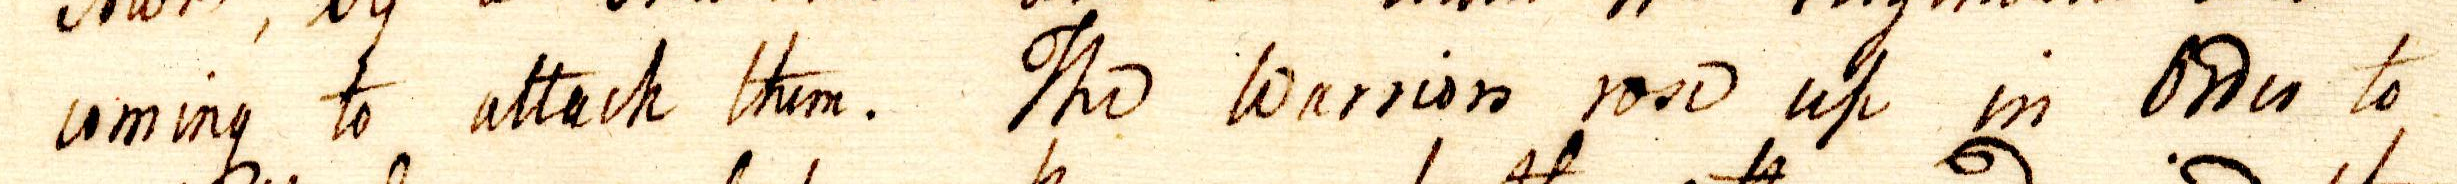coming to attack them. The Warriors rose up in Order to
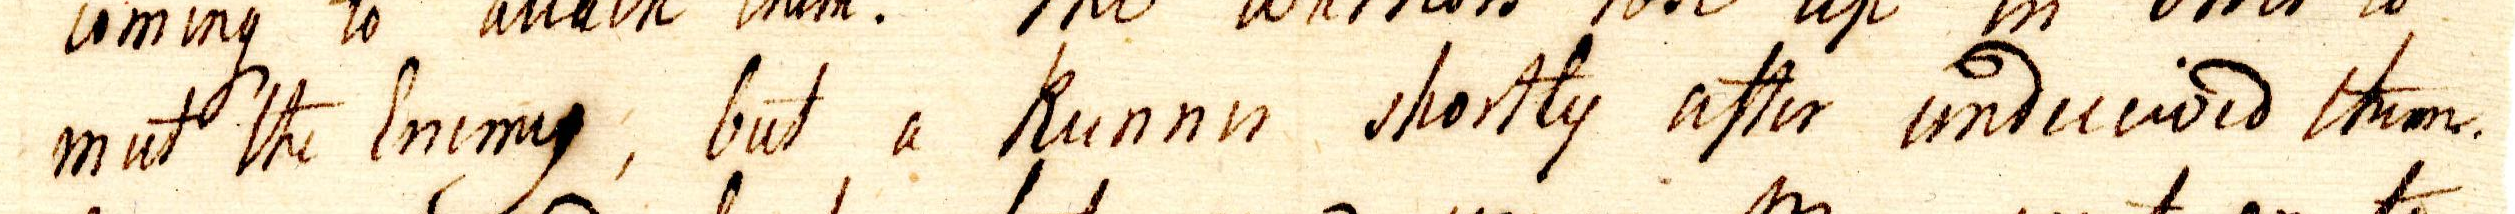meet the Enemy, but a Runner shortly after undeceived them.
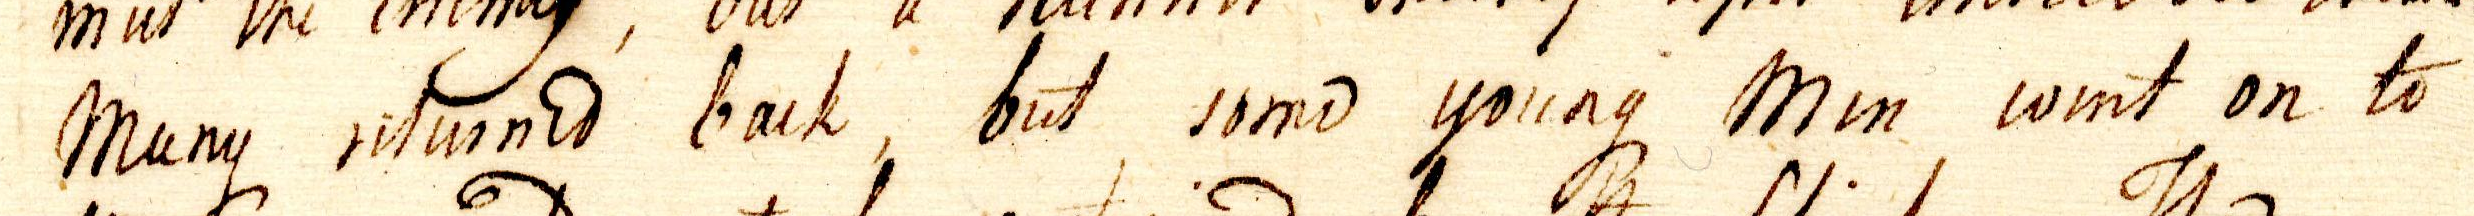Many returned back, but some young Men went on to
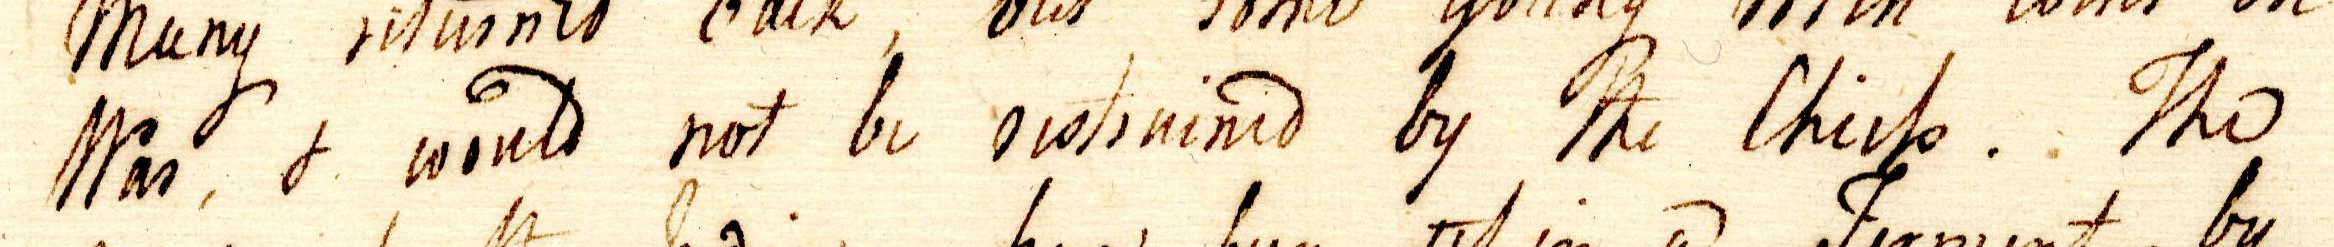War, & would not be restrained by the Chiefs. The
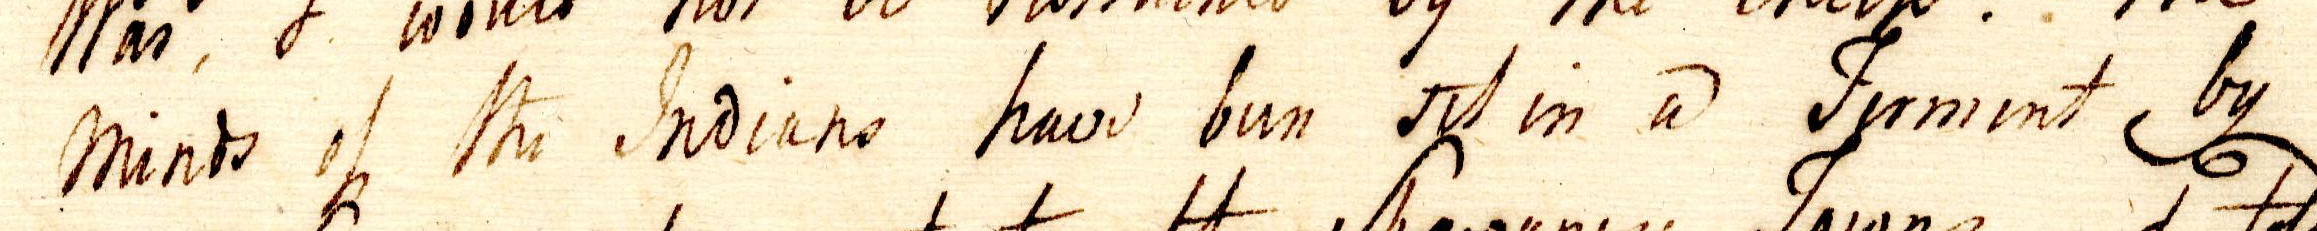Minds of the Indians have been set in a Ferment by
